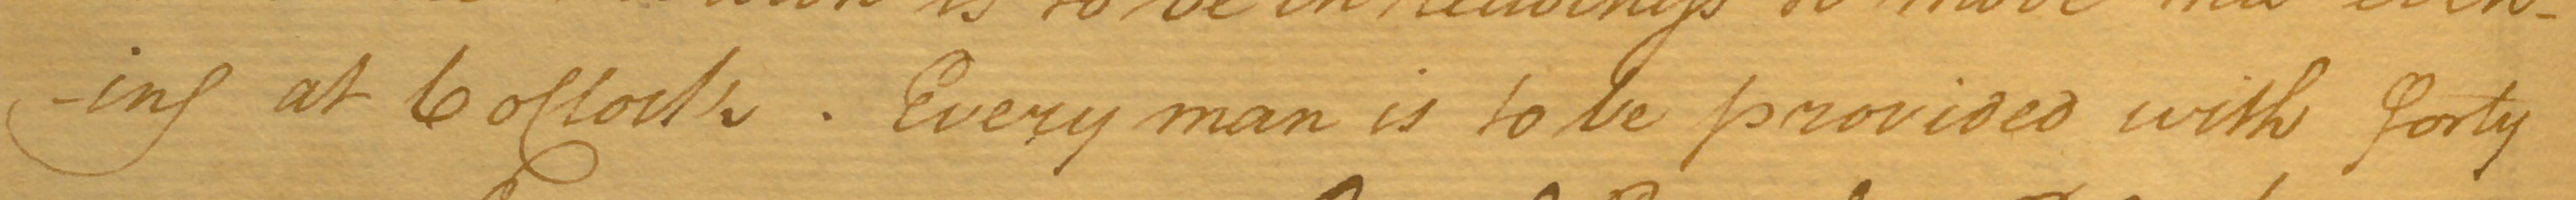-ing at 6 oClock. Every man is to be provided with forty
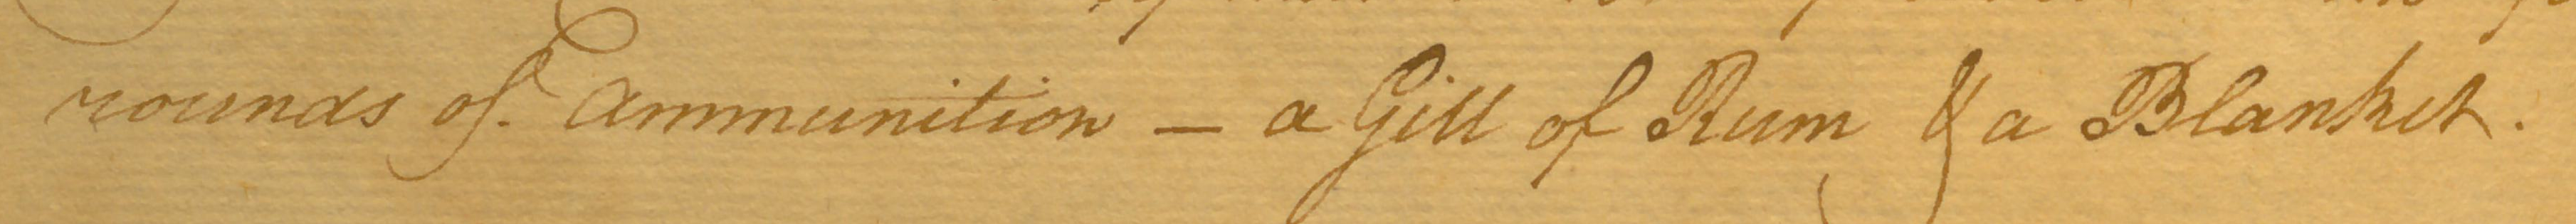rounds of ammunition- a Gill of Rum & a Blanket.
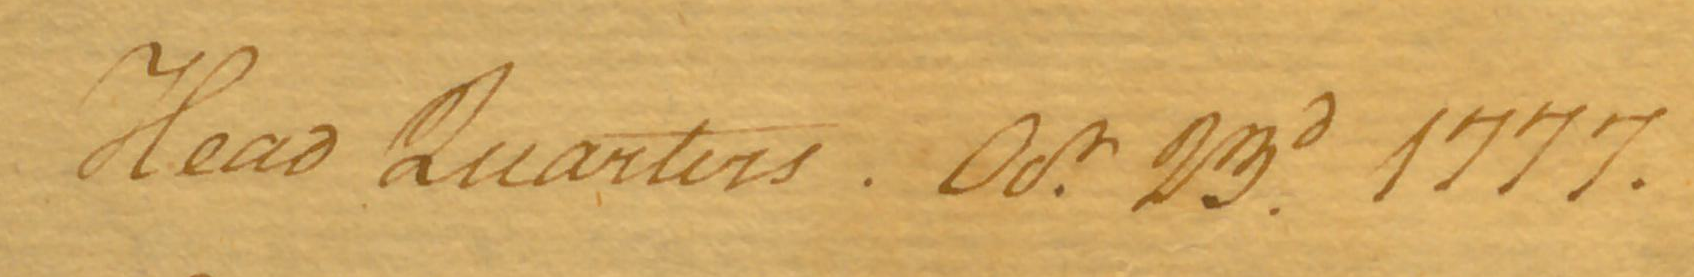Head Quarters. Oc^r. 23^d. 1777.
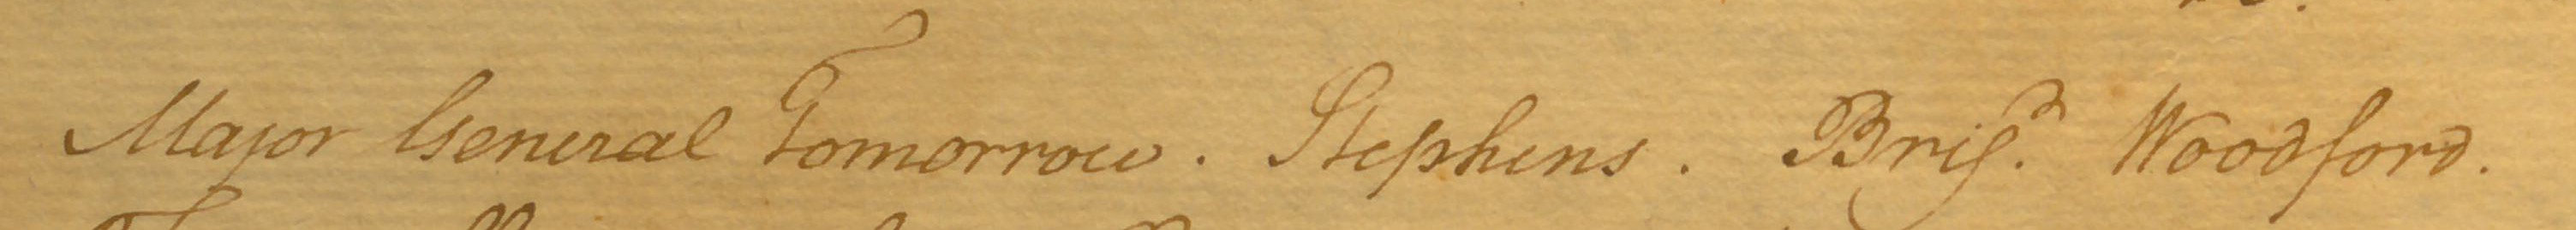Major General Tomorrow. Stephens. Brig^r. Woodford.
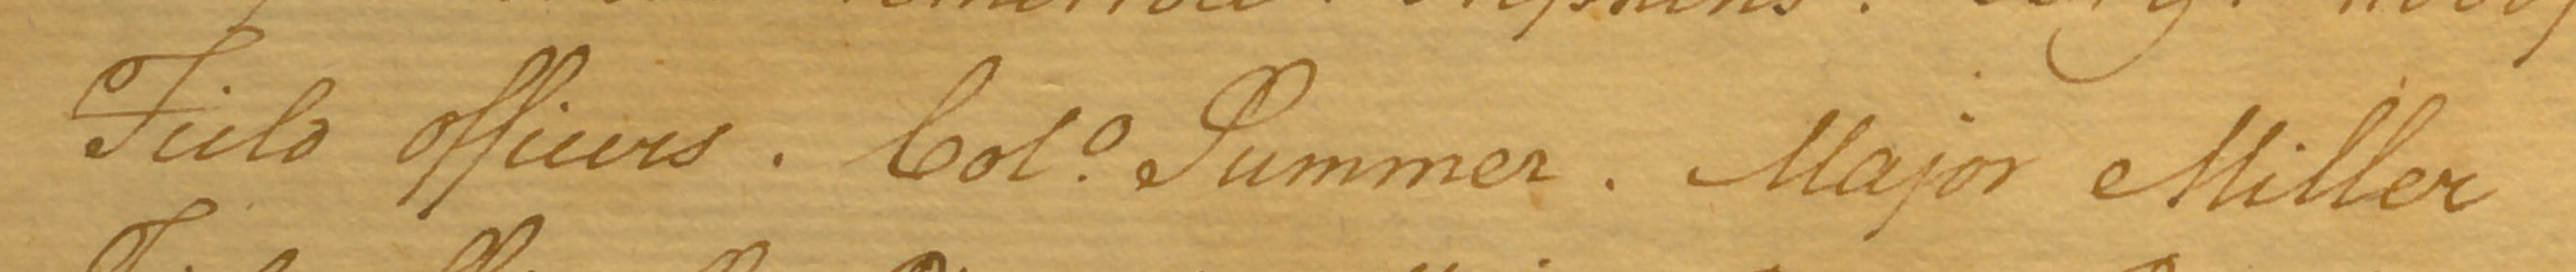Field officers. Col^o. Summer. Major Miller
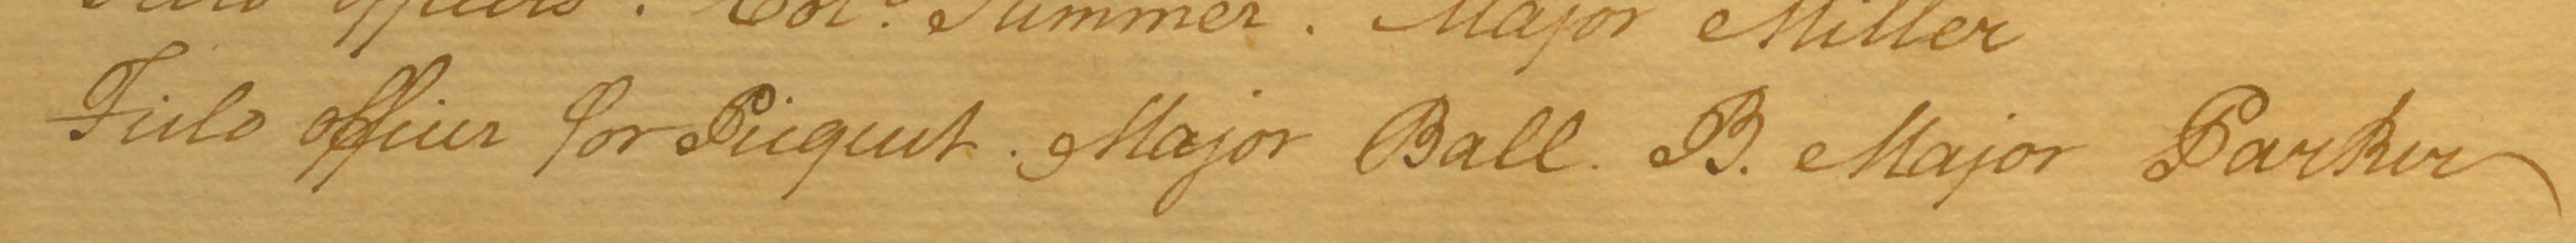Field officer for Picquet. Major Ball. B. Major Parker
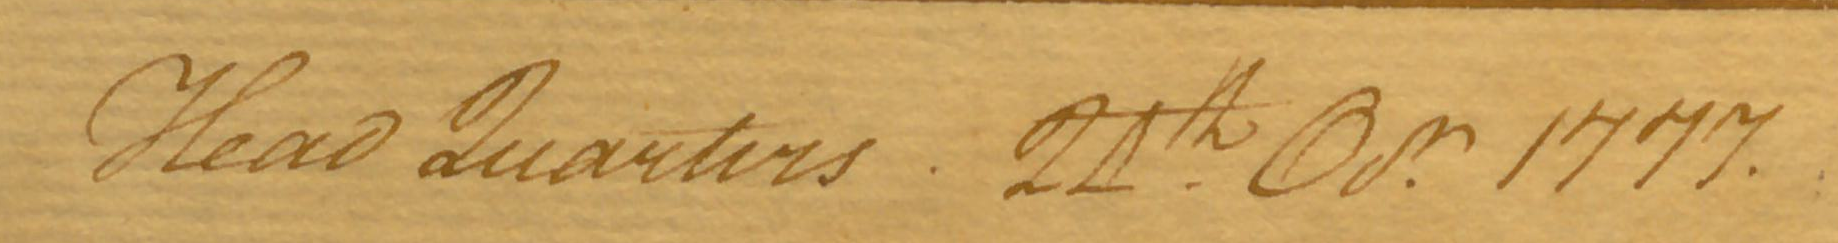Head Quarters. 24^th. Oc^r. 1777.
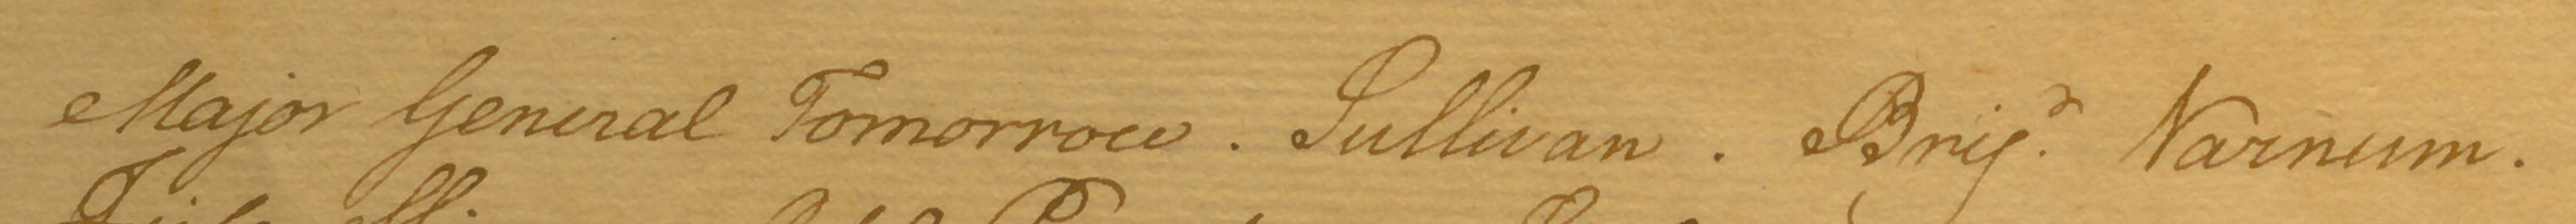Major General Tomorrow. Sullivan. Brig^r. Varnum.
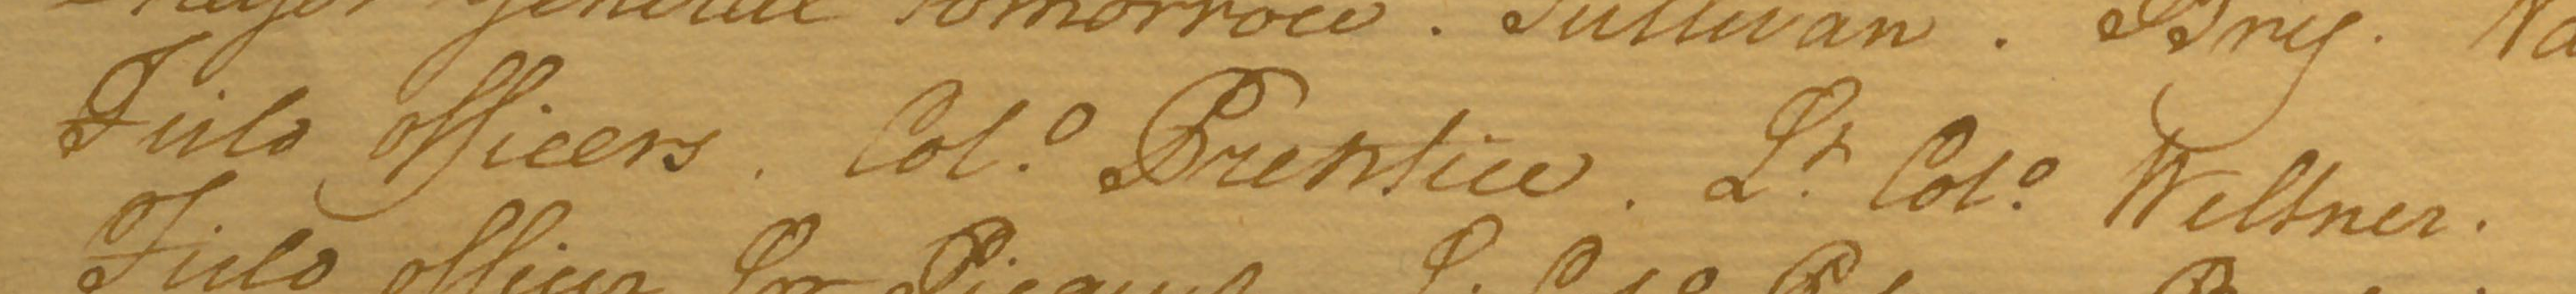Field officers. Col^o. Prentince. L^t. Col^o. Weltner.
